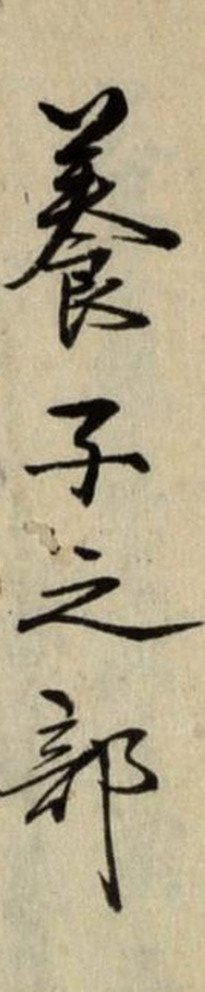養子之部
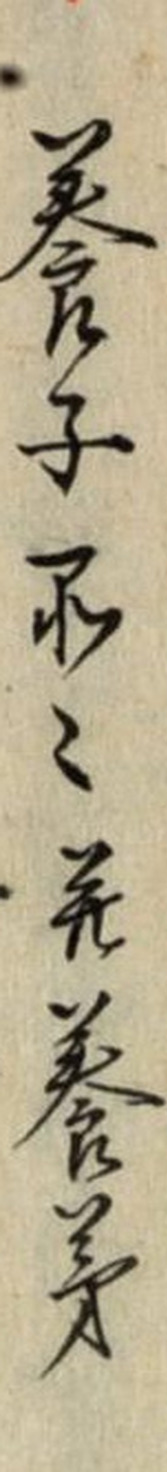イ養子品々并養弟
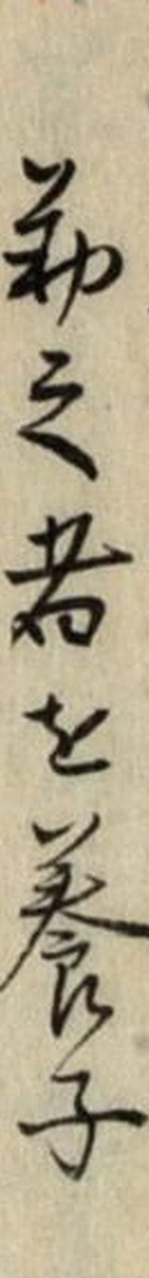ロ勤之者を養子
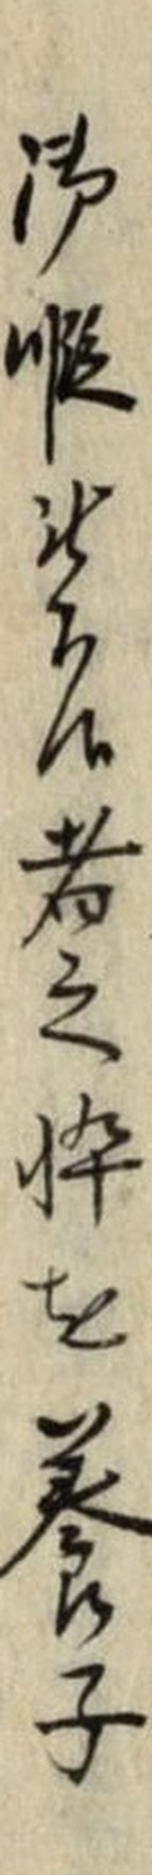ハ御暇被下候者之忰を養子
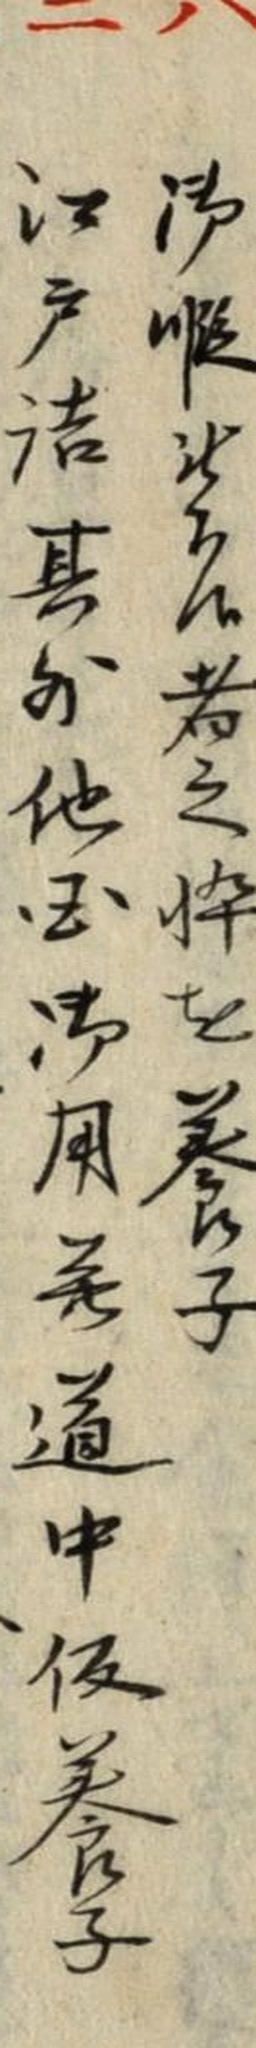二江戸詰其外他国御用并道中仮養子
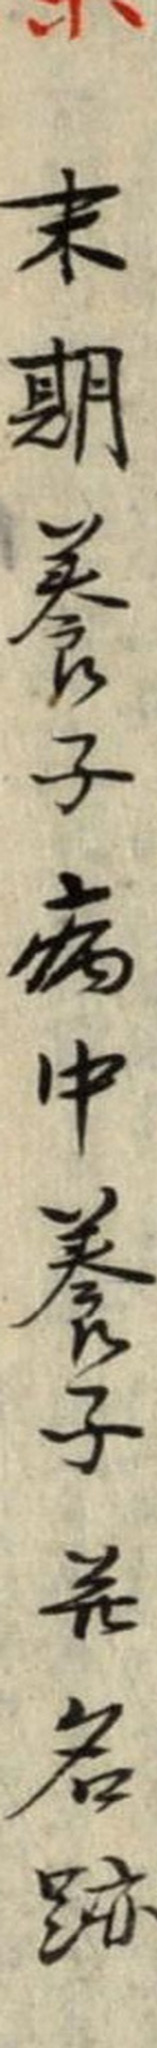ホ末期養子病中養子并名跡
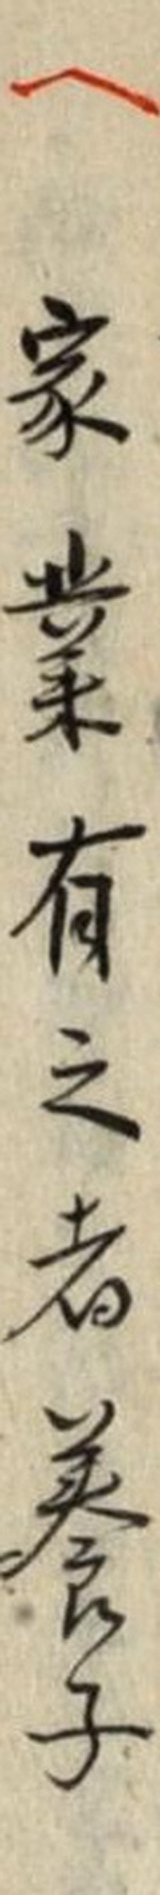ヘ家業有之者養子
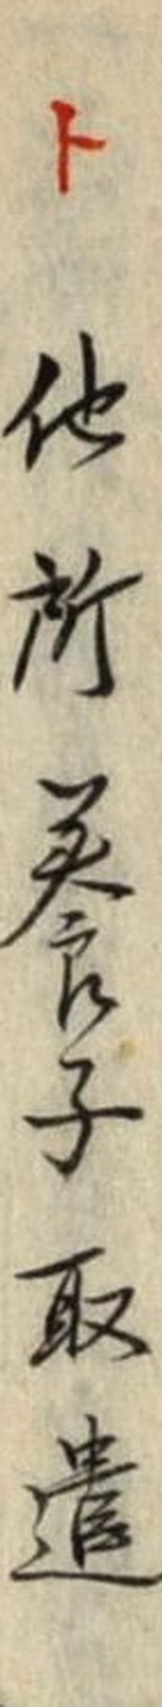ト他所養子取遣
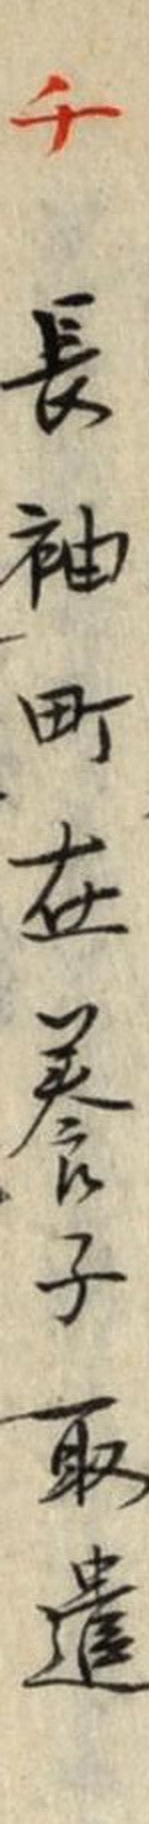チ長袖町在養子取遣
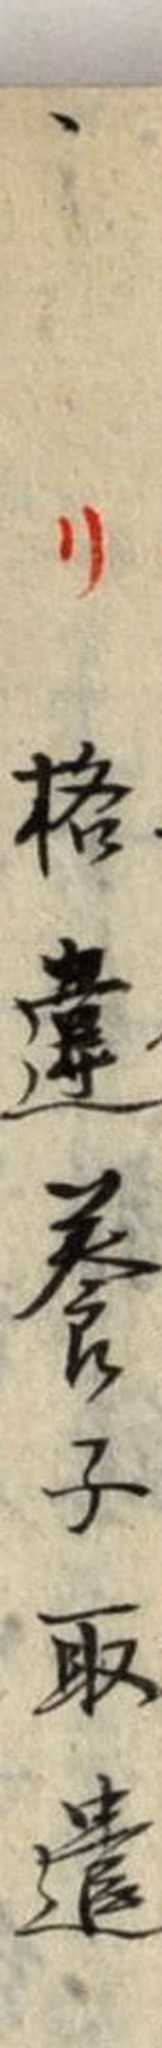リ格違養子取遣
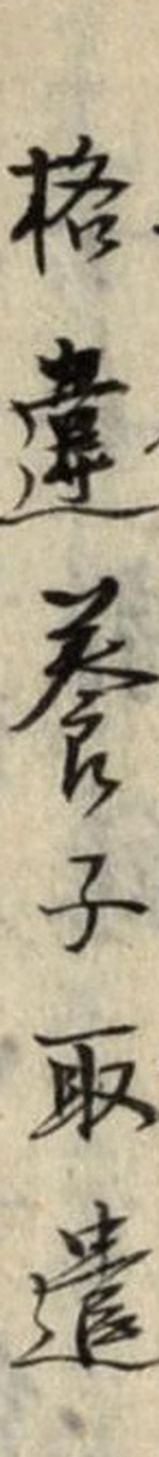リ格違養子取遣
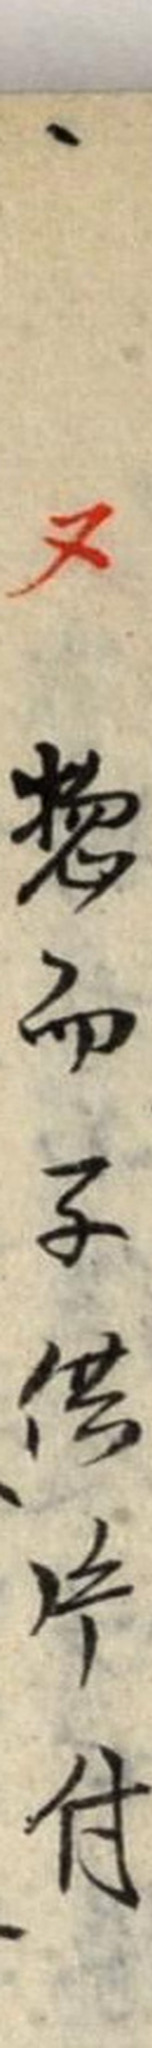ヌ惣而子供片付
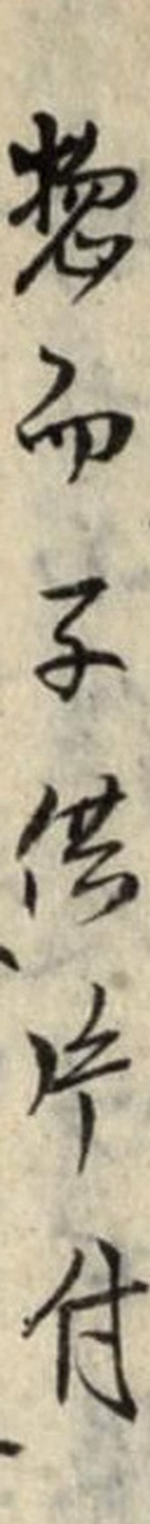ヌ惣而子供片付
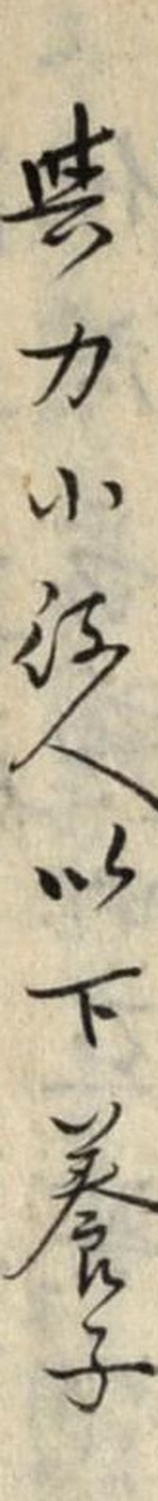ル与力小役人以下養子
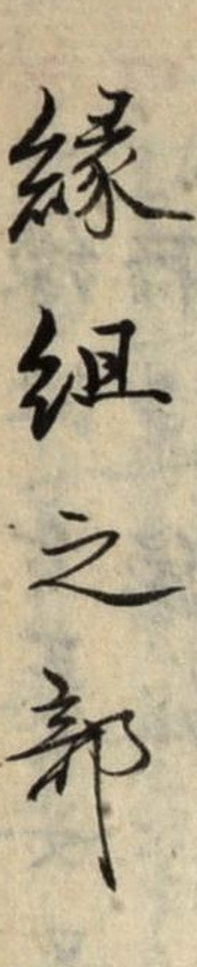縁組之部

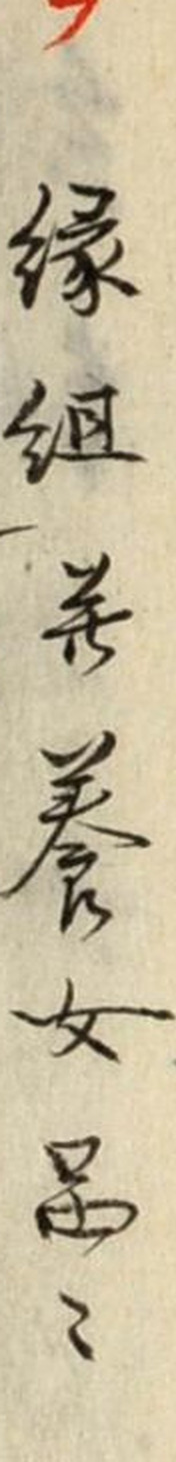ヲ縁組并養女品々
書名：養子縁組之部
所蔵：福井県文書館 Fukui Prefectural Archives
